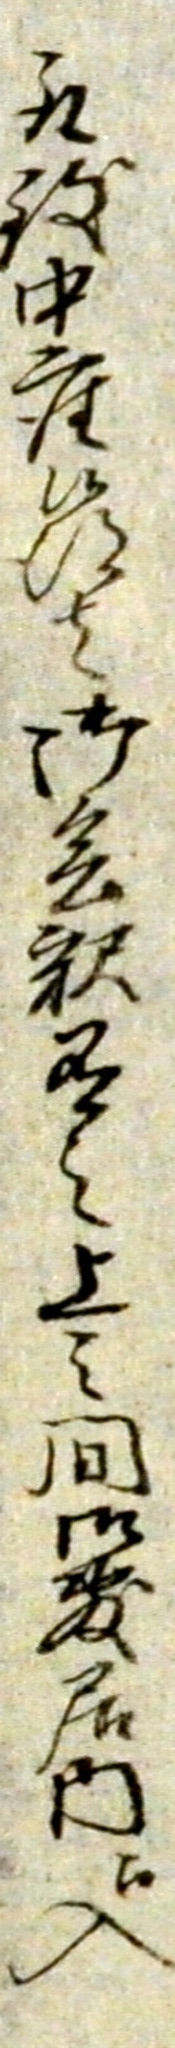取致中座候得者御会釈有之上之間御敷居内江入
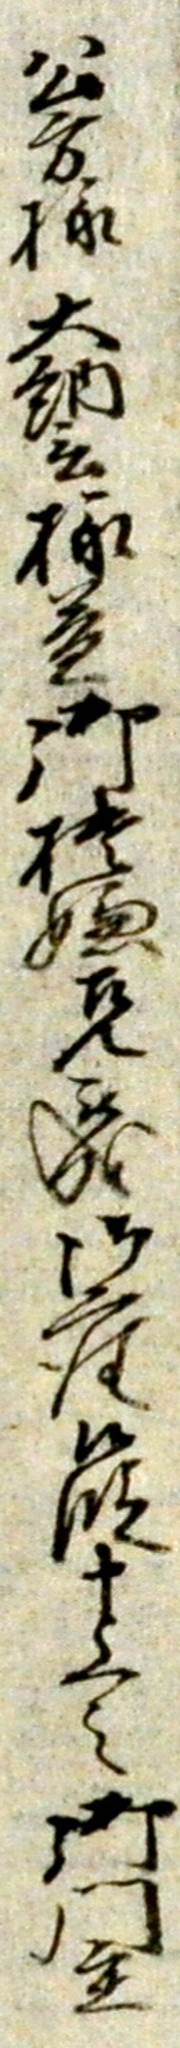公方様大納言様益御機嫌克被成御座候段申上之御門主
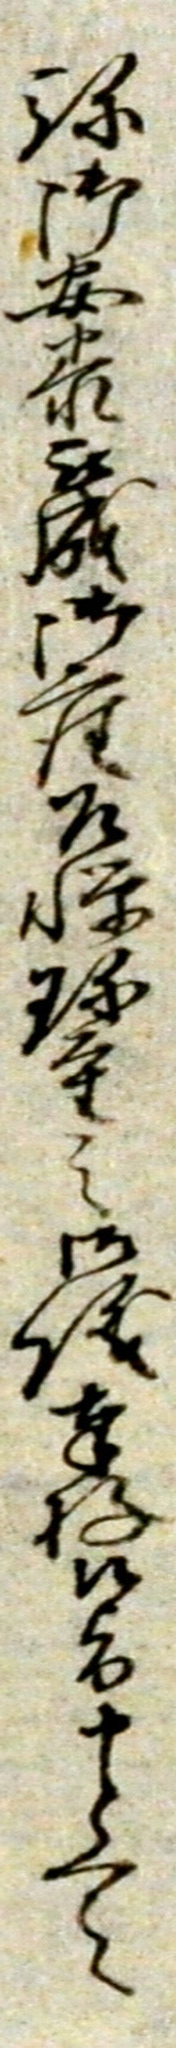弥御安泰被成御座乍憚珍重之御儀奉存候旨申上之
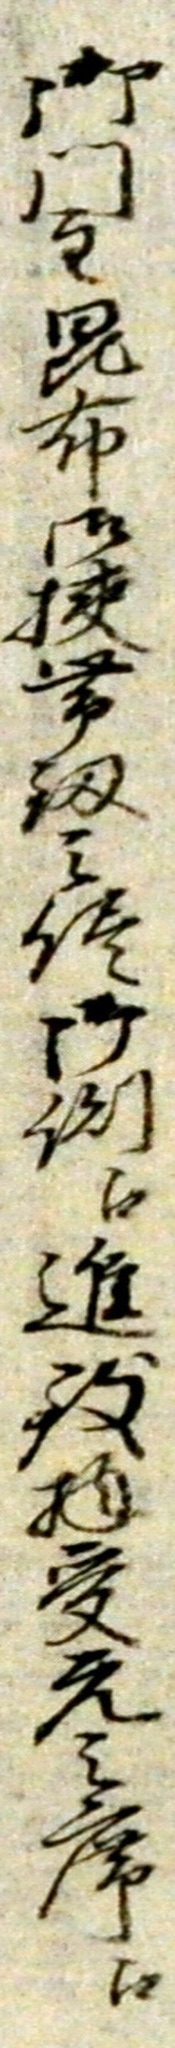御門主昆布御挟帯剣之儘御側江進致拝受元之席江
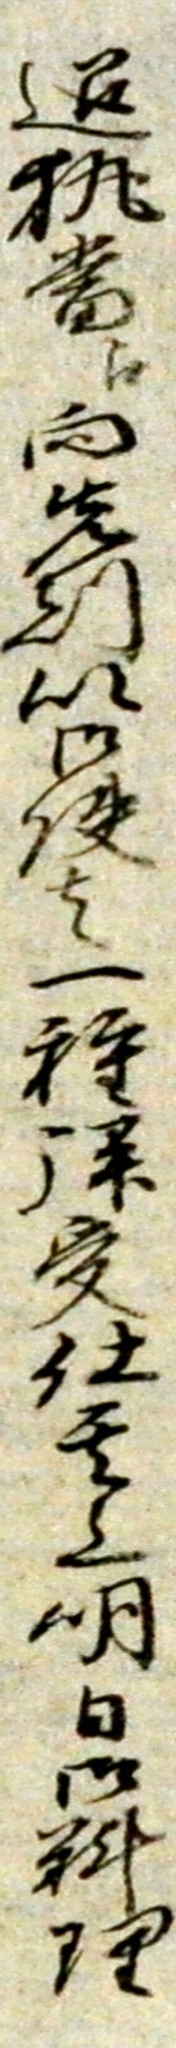退執番江向先刻以御使者一種拝受仕其上明日御料理
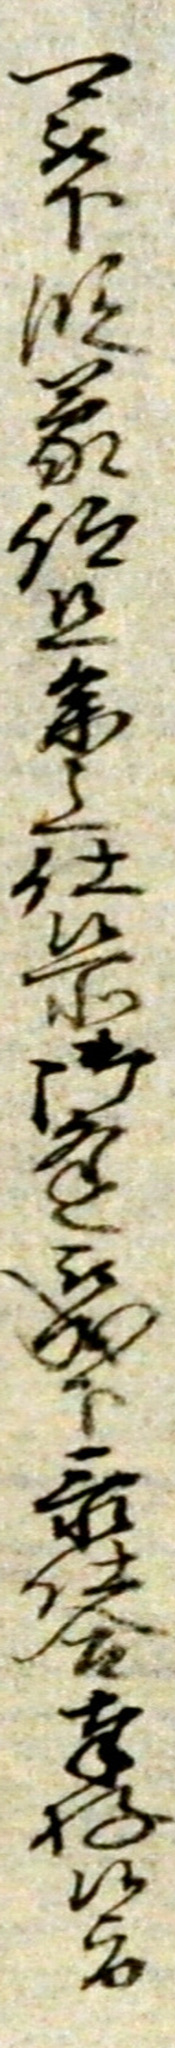可被下段蒙仰且参上仕候所御逢被成下忝仕合奉存候旨
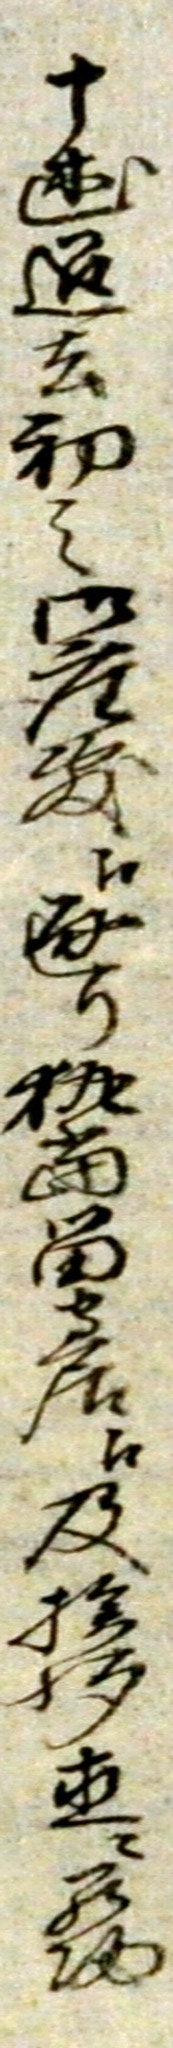申述退去初之御座敷江通り執当留守居江及挨拶直ニ罷帰
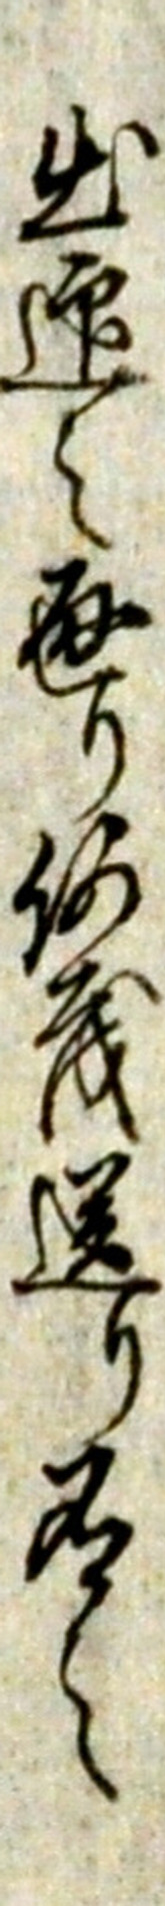出迎之通り何茂送り有之
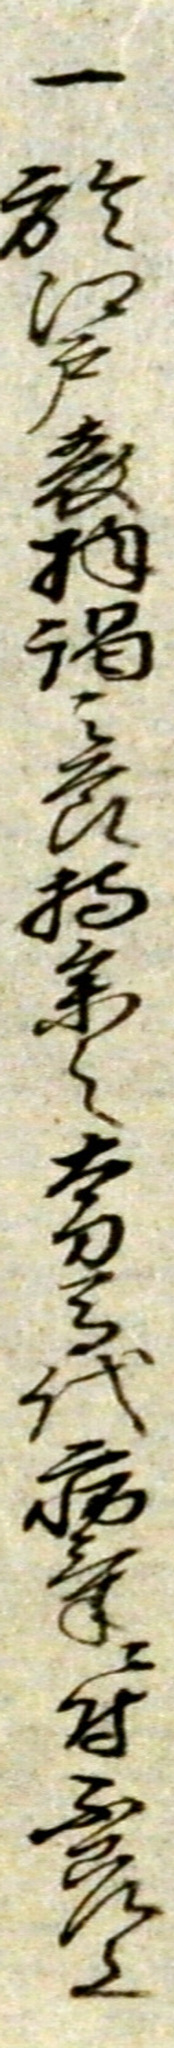一於江戸表拝謁之節持参之太刀馬代病気ニ付不差上
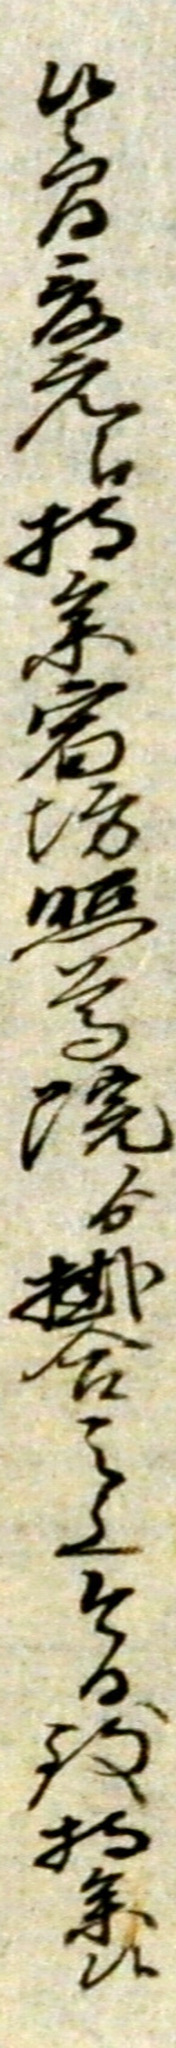候之間爰元江持参宿坊照尊院ゟ掛合之上今日致持参候
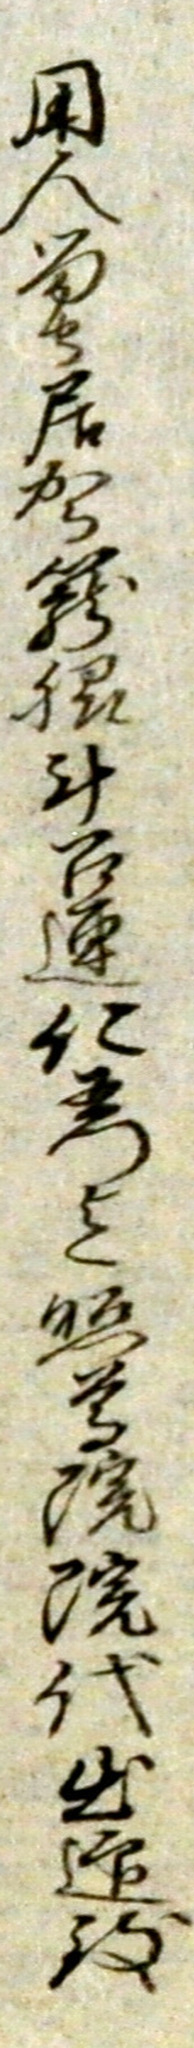用人留守居駕籠脇計召連仁王門院迄照尊院院代出迎致
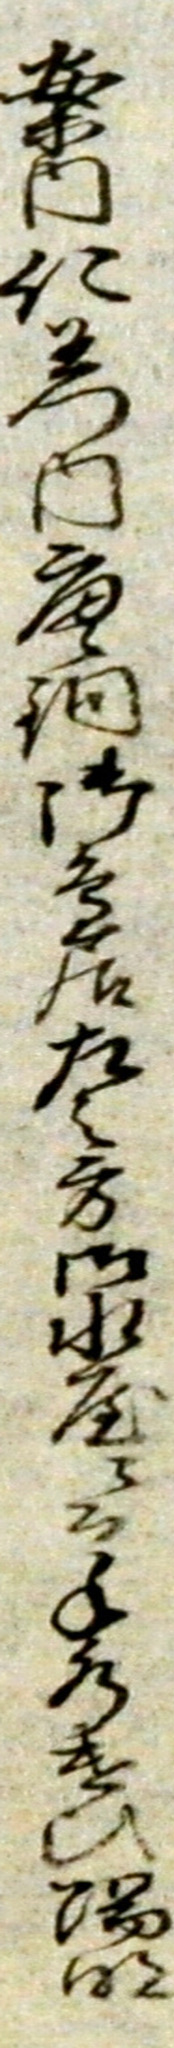案内仁王門唐銅御鳥居左之方御水屋ニ而手水遣ひ陽明

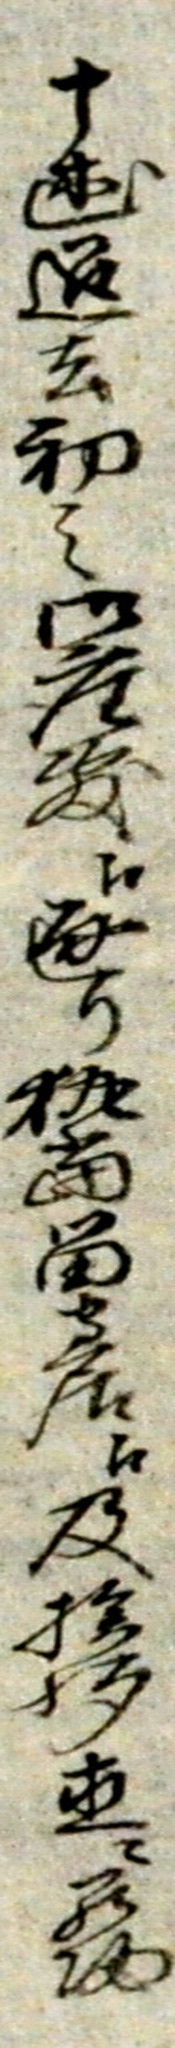申述退去初之御座敷江通り執當留守居江及挨拶直ニ罷帰
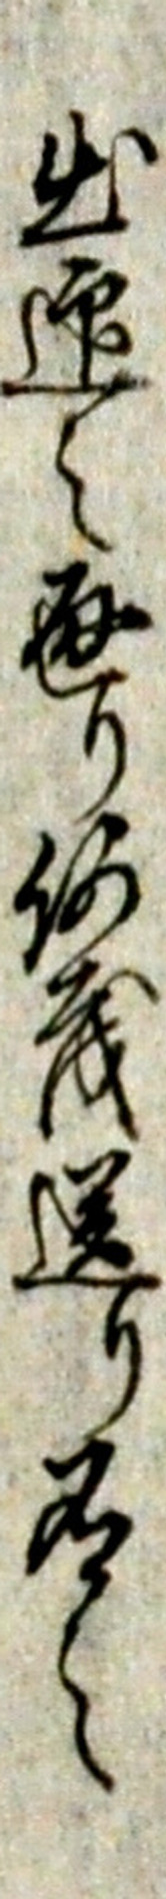出迎之通り何茂送り有之
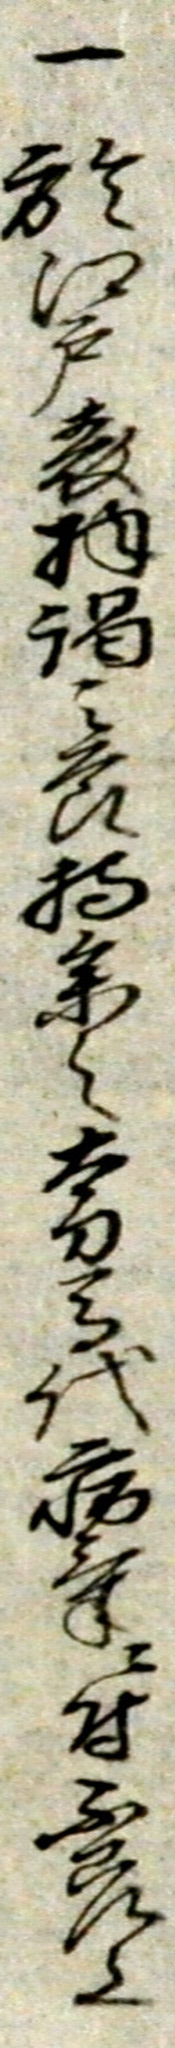一於江戸表拝謁之節持参之太刀馬代病気ニ付不差上
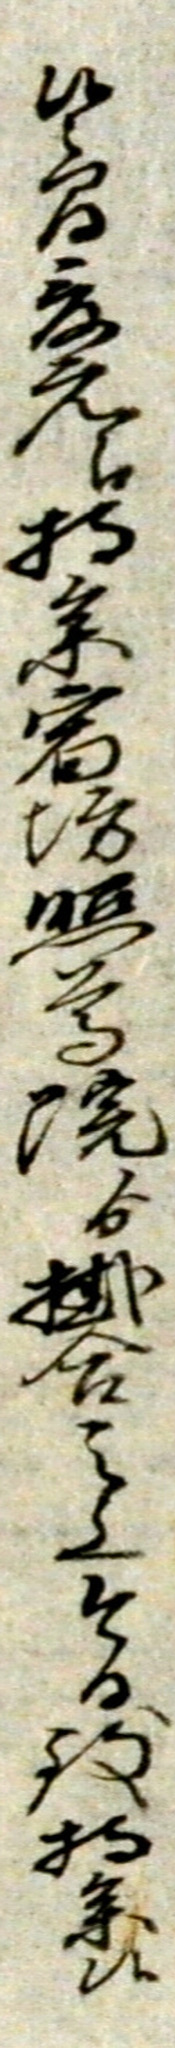候間爰元江持参宿坊照尊院ゟ掛合之上今日致持参候
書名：日光御名代相勤候節ノ留
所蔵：伊那市立高遠町図書館・合同会社AMANE
